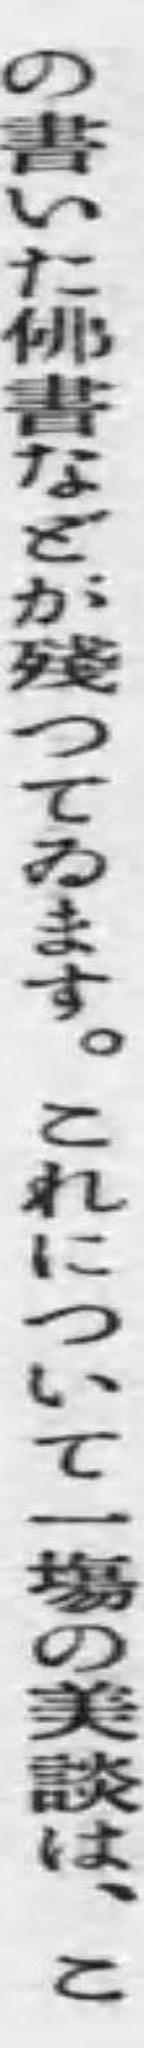の書いた仏書などが残つてゐます。これについて一場の美談は、こ
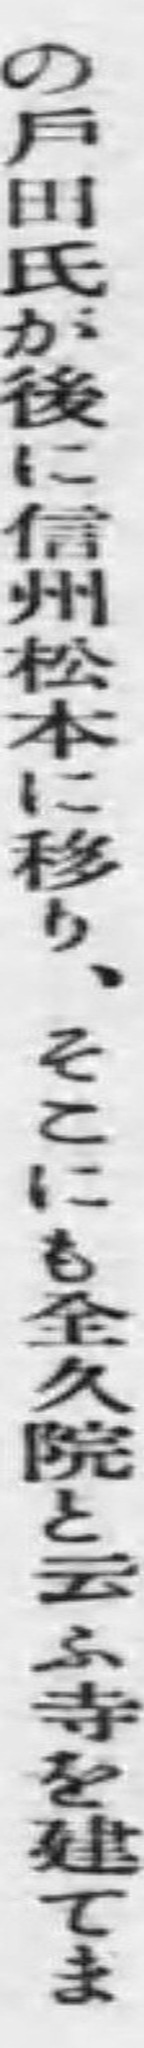の戸田氏が後に信州松本に移り、そこにも全久院と云ふ寺を建てま
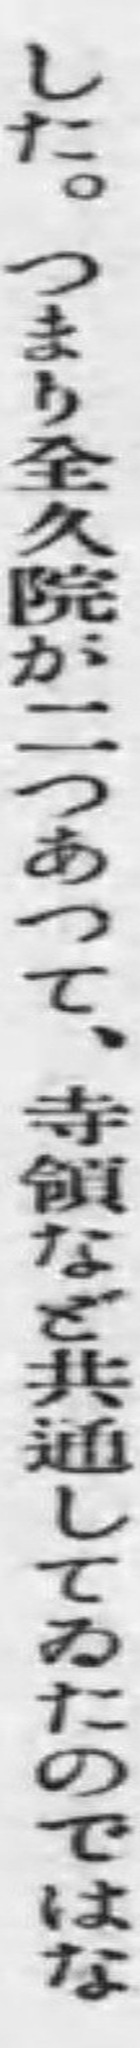した。つまり全久院が二つあつて、寺領など共通してゐたのではな
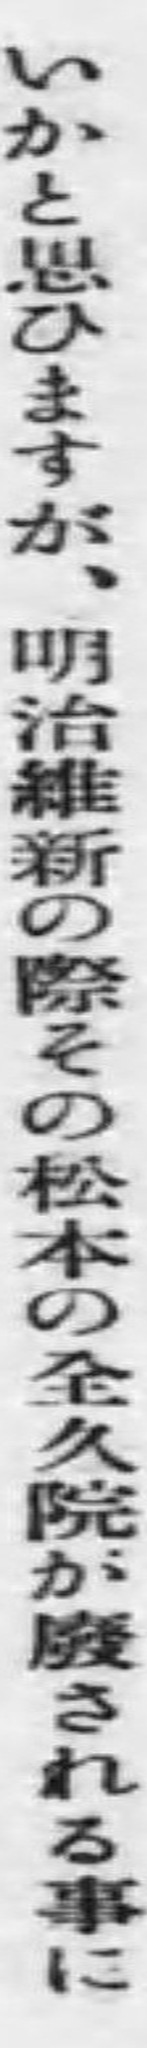いかと思ひますが、明治維新の際その松本の全久院が廃される事に
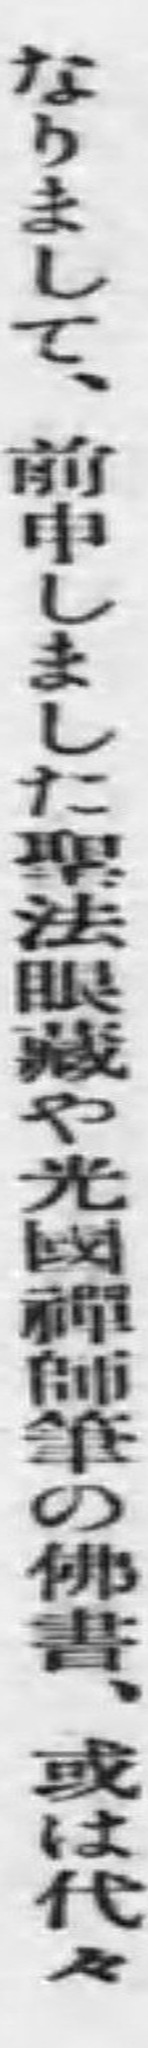なりまして、前申しました聖法眼蔵や光国禅師筆の仏書、或は代々
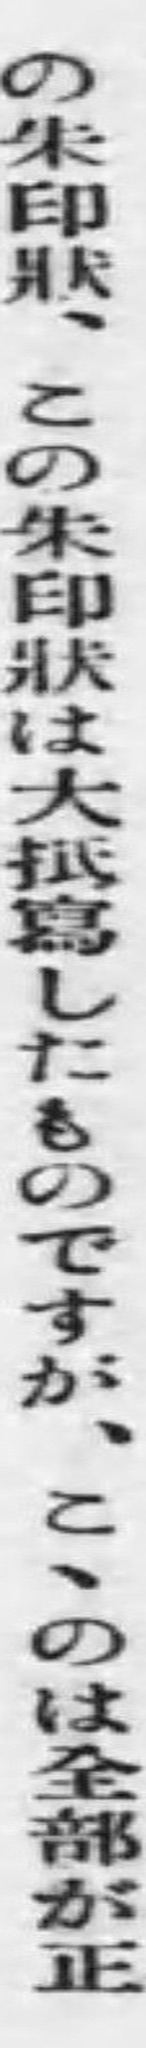の朱印状、この朱印状は大抵写したものですが、こゝのは全部が正

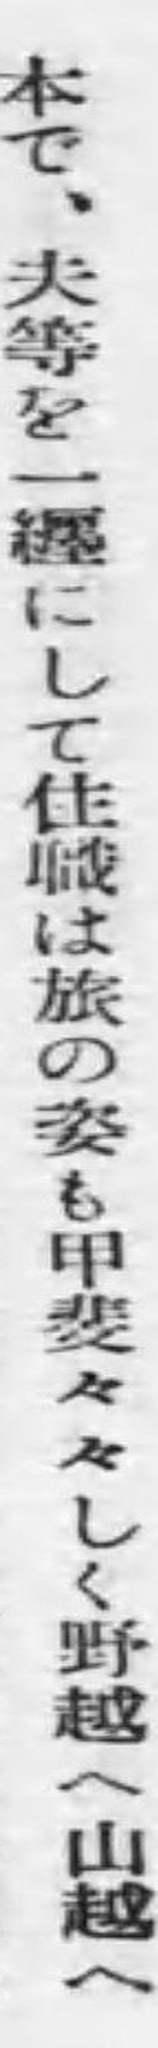本で、夫等を一纏にして住職は旅の姿も甲斐々々しく野越へ山越へ
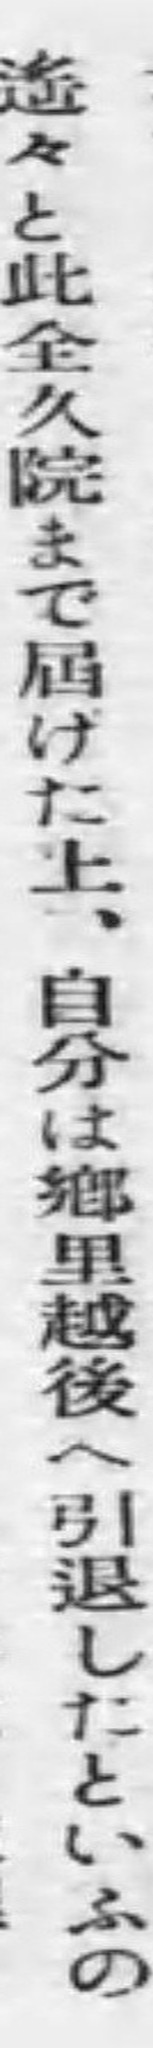遥々と此全久院まで届けた上、自分は郷里越後へ引退したといふの
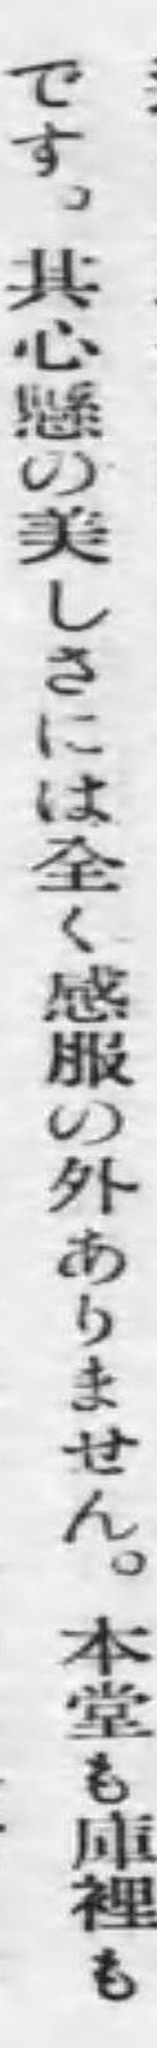です。其心懸の美しさには全く感服の外ありません。本堂も庫裡も
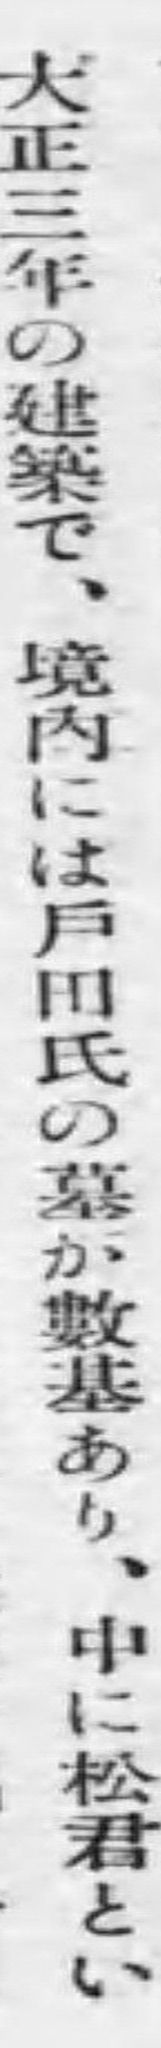大正三年の建築で、境内には戸田氏の墓が数基あり、中に松君とい
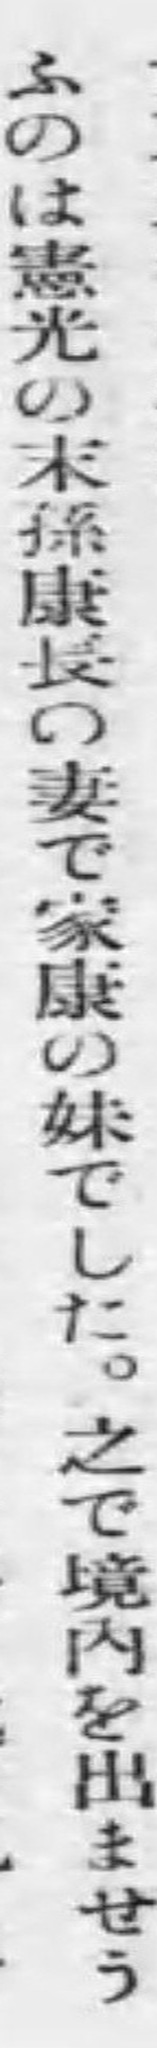ふのは憲光の末孫康長の妻で家康の妹でした。之で境内を出ませう
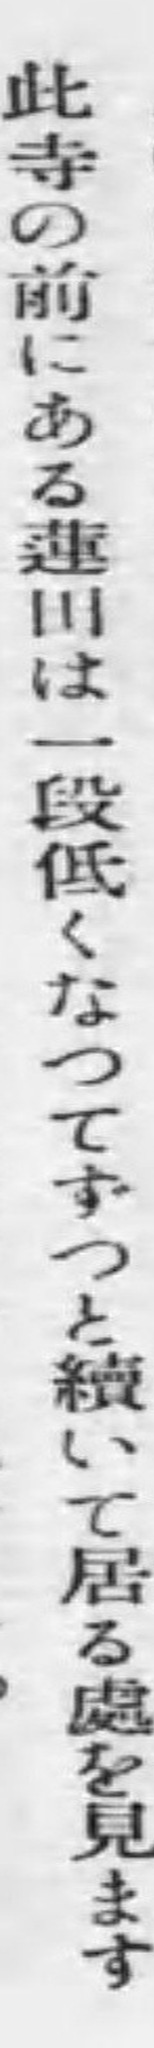此寺の前にある蓮田は一段低くなつてずつと続いて居る処を見ます
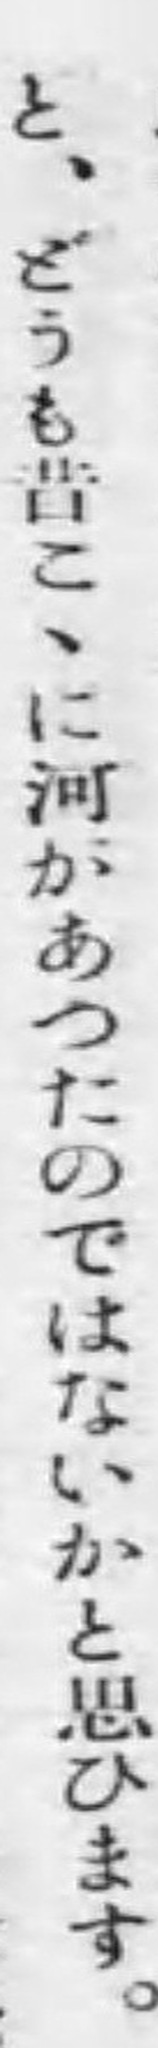と、どうも昔こゝに河があつたのではないかと思ひます。
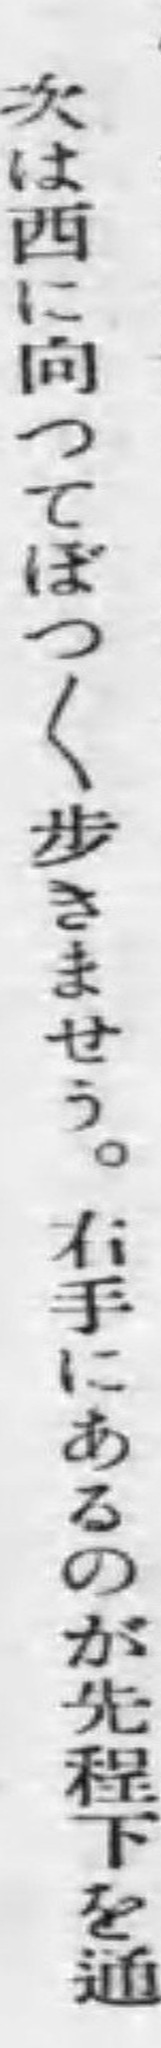次は西に向つてぼつ〳〵歩きませう。右手にあるのが先程下を通
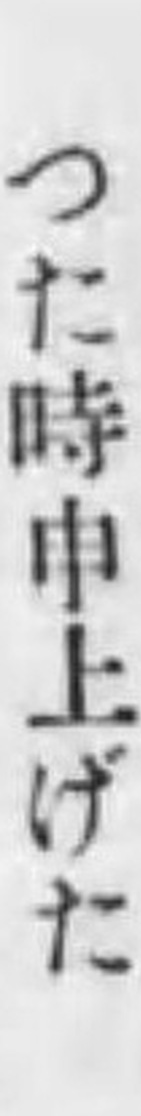つた時申上げた
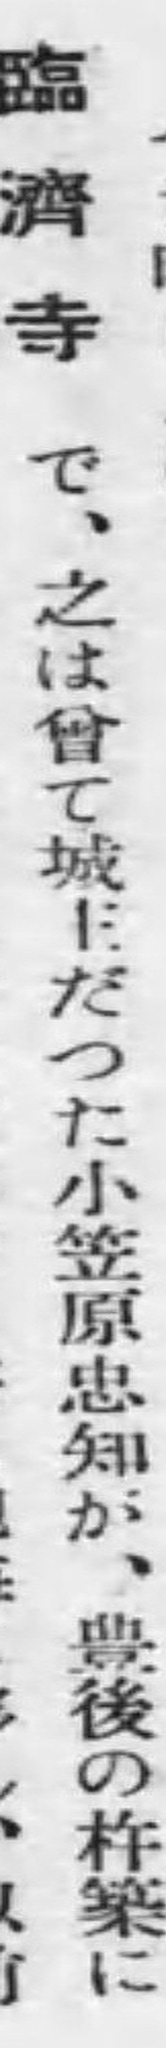臨済寺で、之は曽て城主だつた小笠原忠知が、豊後の杵築に
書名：東三河道中記 : 豊橋市及其附近案内
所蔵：国立国会図書館 National Diet Library, JAPAN
